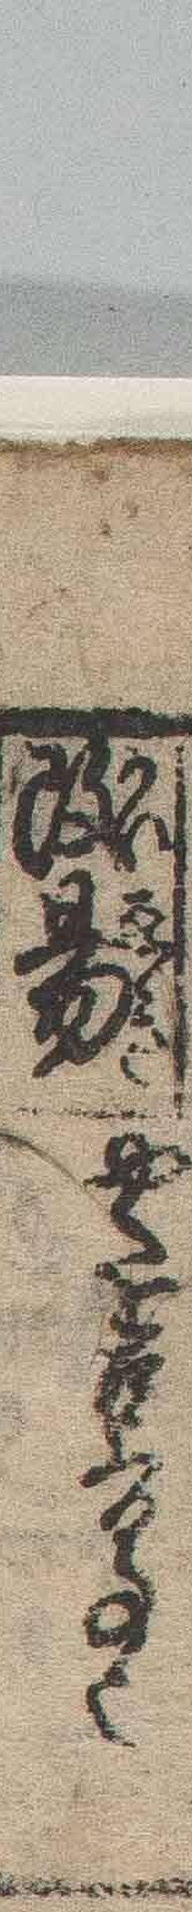改易やくを召上る事也
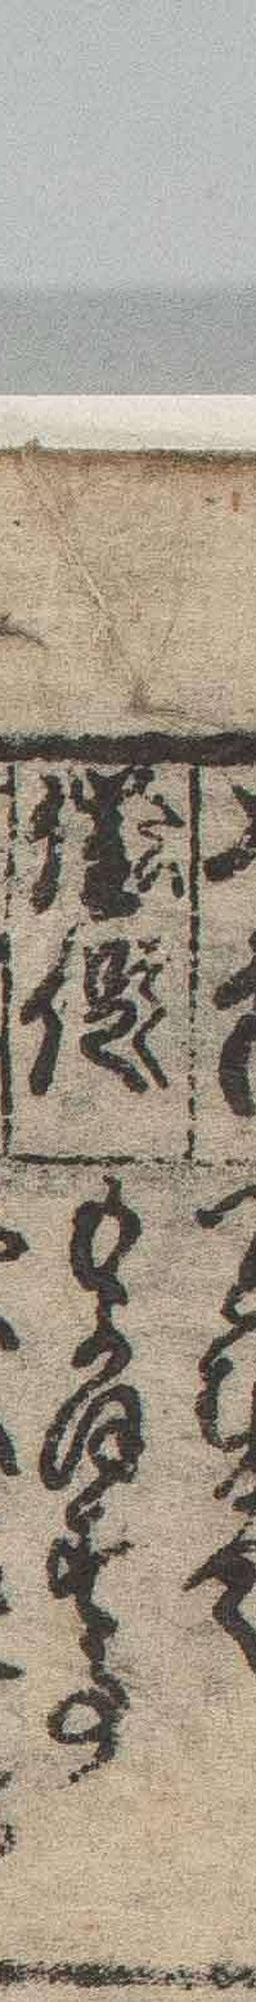催促もよほす事
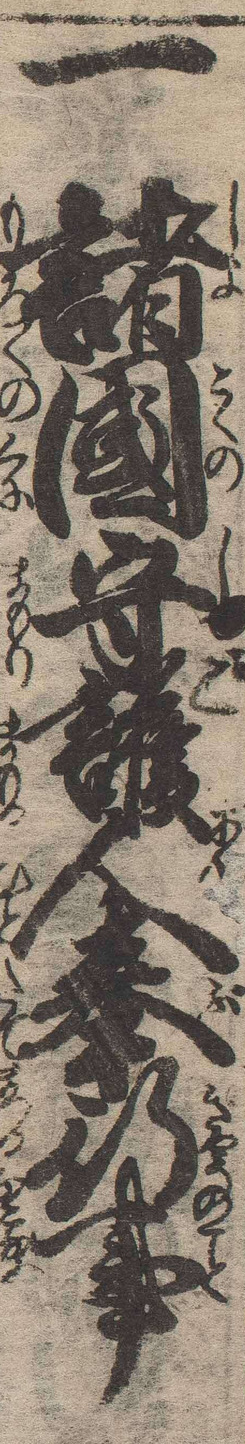一諸國守護人奉行事
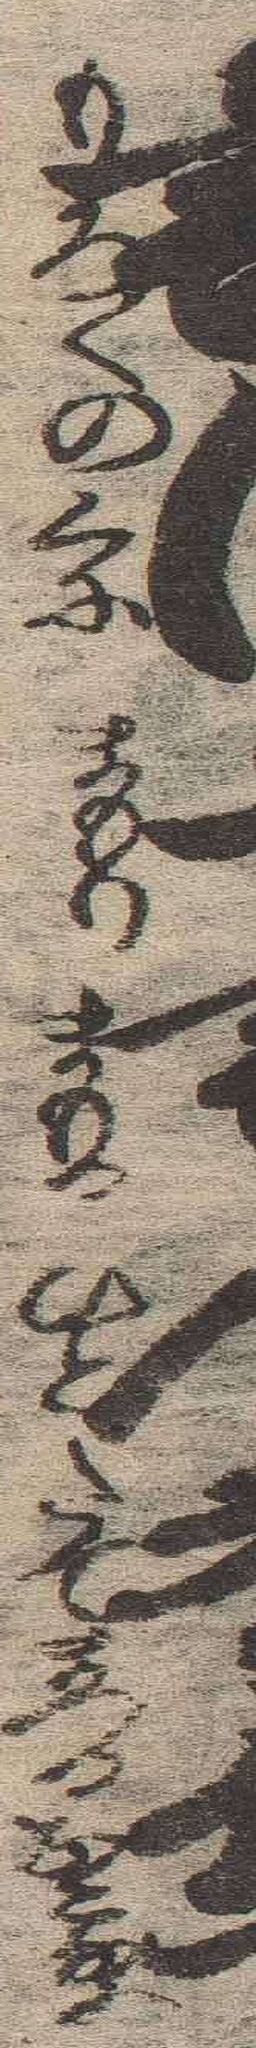もろ〳〵のくにまもりまもるひとたてまつるをこなふ
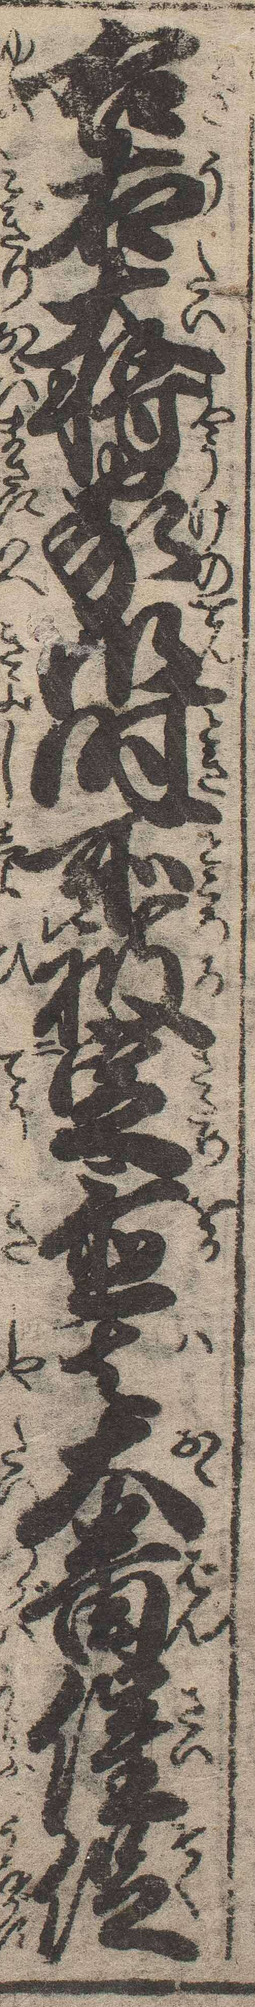右右大将家御時所被定置者大番催促
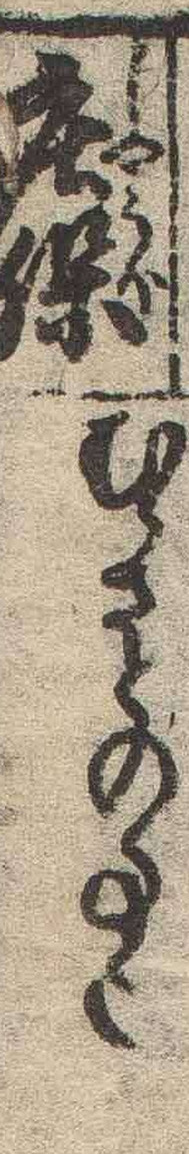庄保むらさとの事
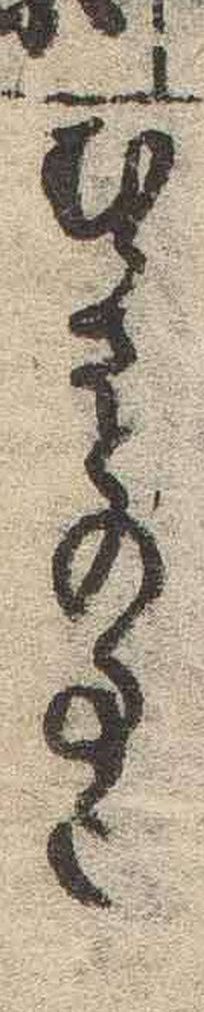庄保むらさとの事
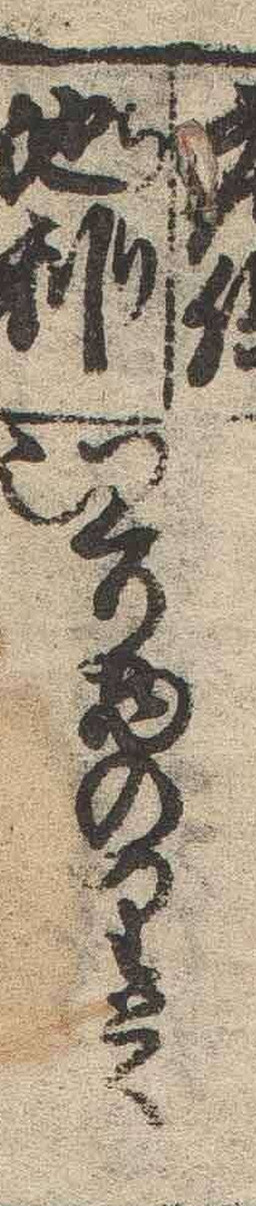地利つくり物のりとく
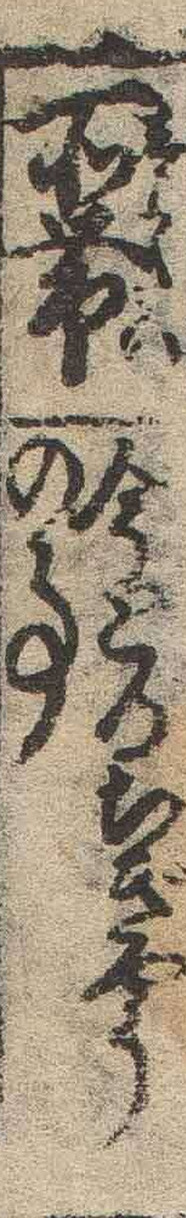所帯今とるちぎやう
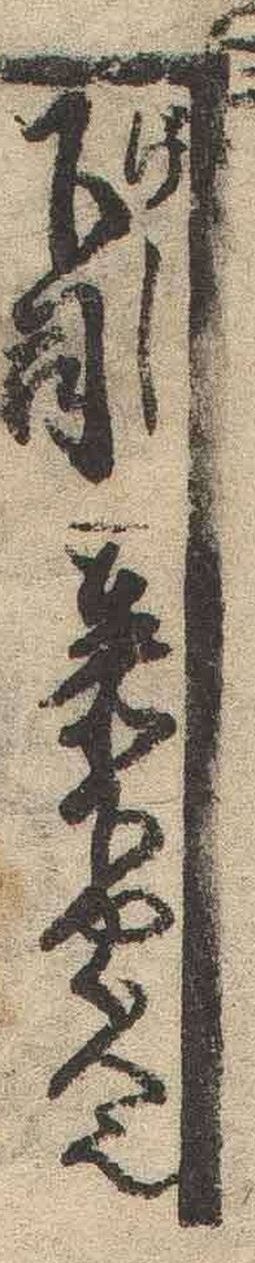下司在所下やく人也
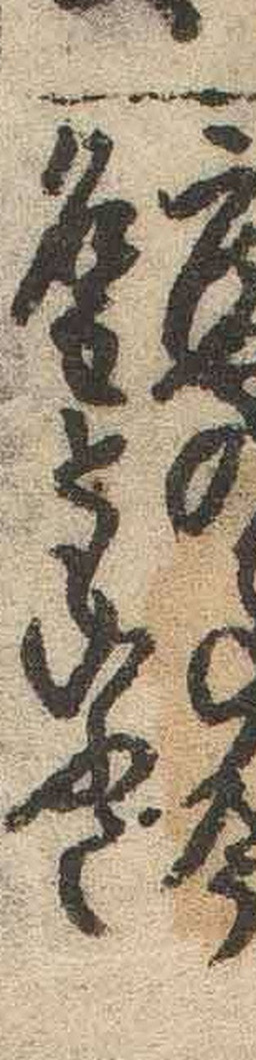名主ともいふ也
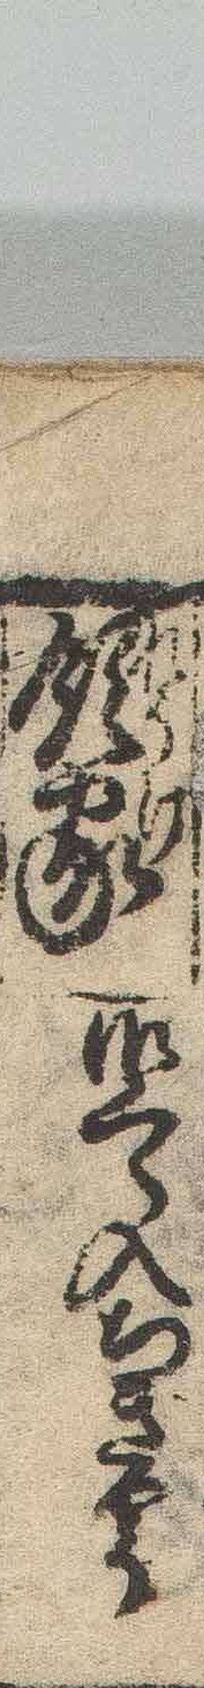領家御くら入ちきやう
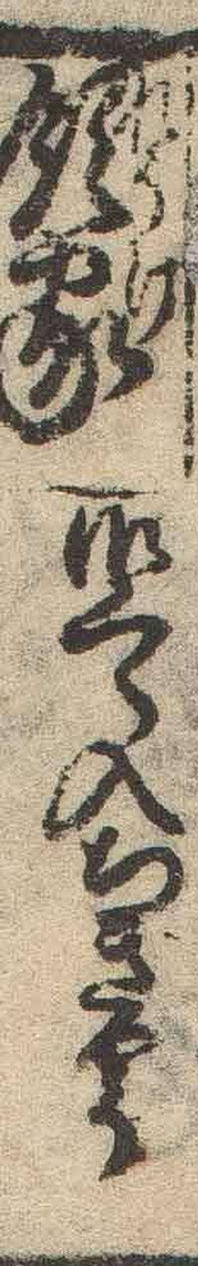領家御くら入ちきやう
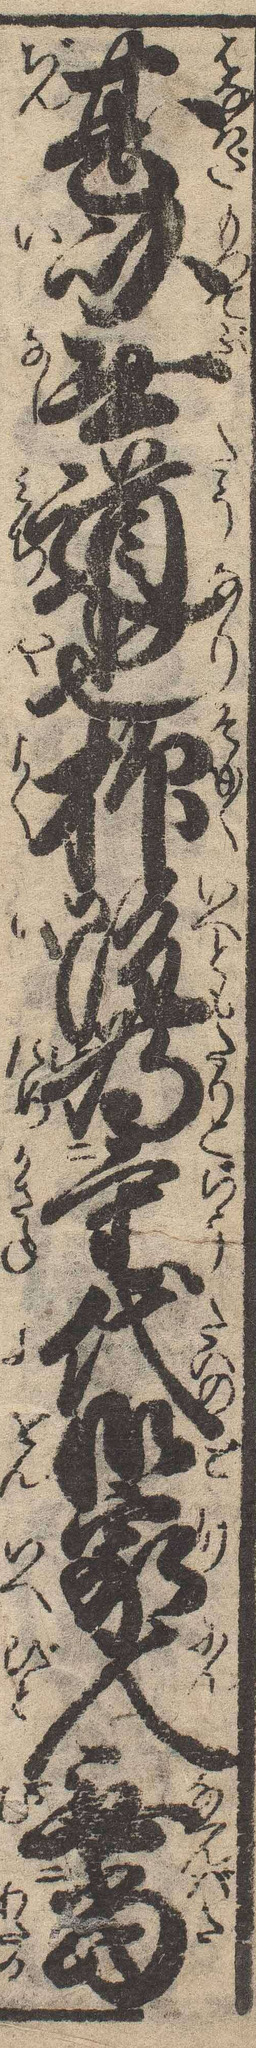甚以無道也抑雖為重代御家人無當
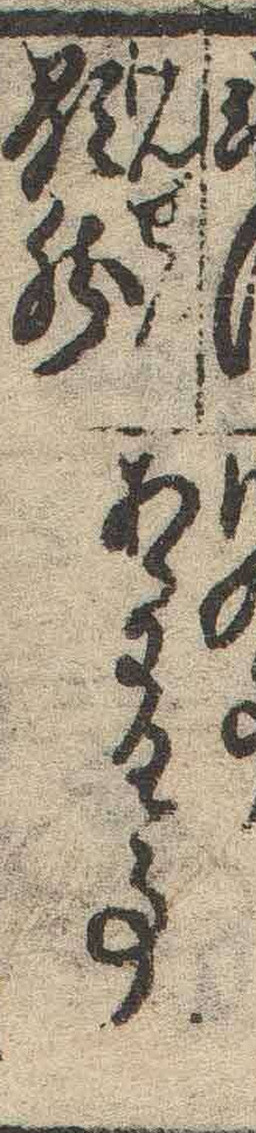顕然あらわるゝ事
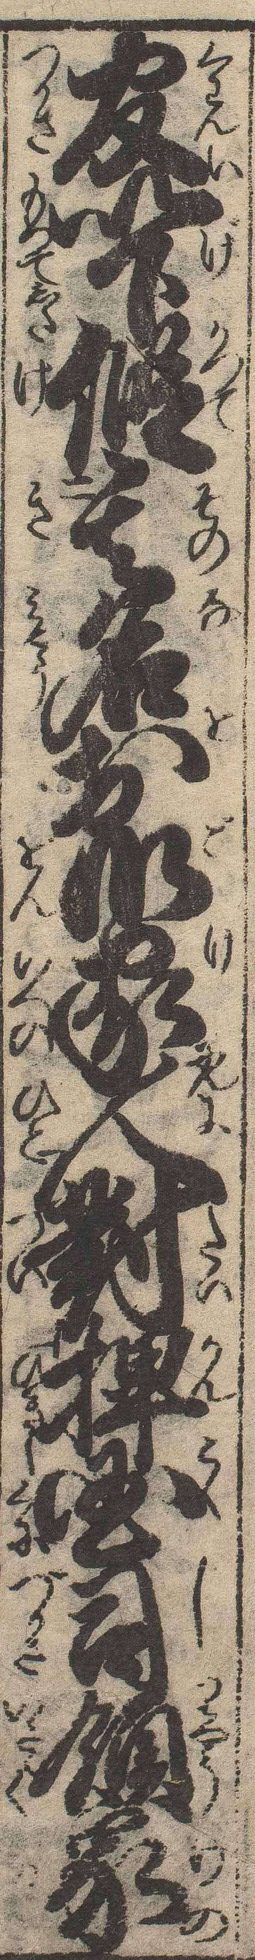官以下假其名於御家人對-捍国司領家
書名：御成敗式目絵抄
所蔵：東京学芸大学附属図書館 国文学研究資料館
